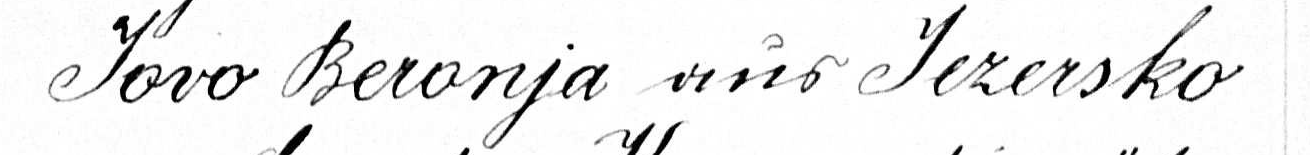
Jovo Beronja aus Jezersko
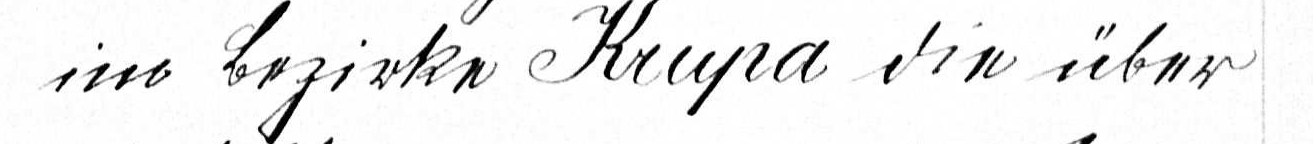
im Bezirke Krupa die über
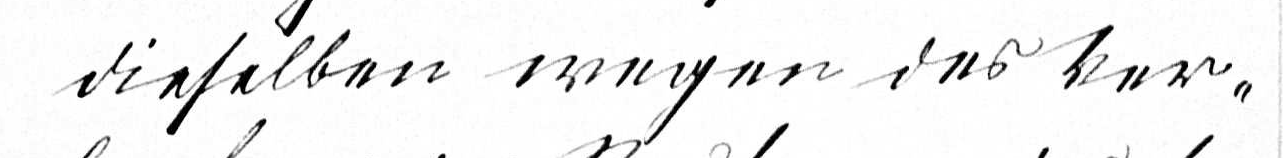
dieselben wegen des Ver¬
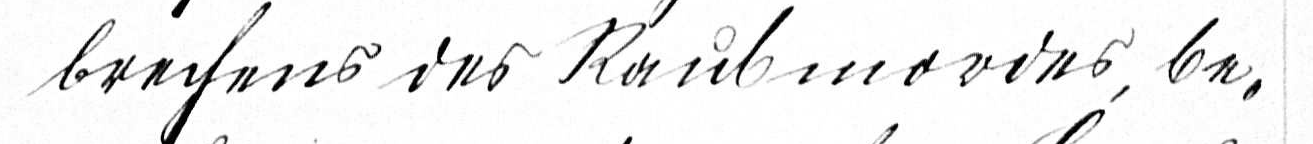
brechens des Raubmordes, be¬
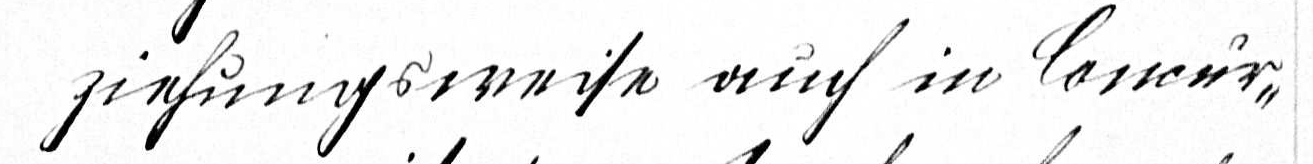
ziehungsweise auch in Concurr¬
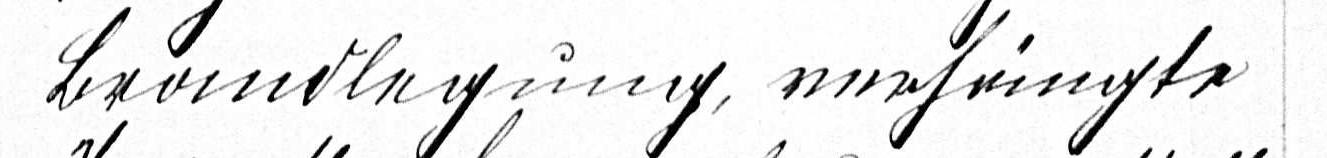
Brandlegung, verhängte
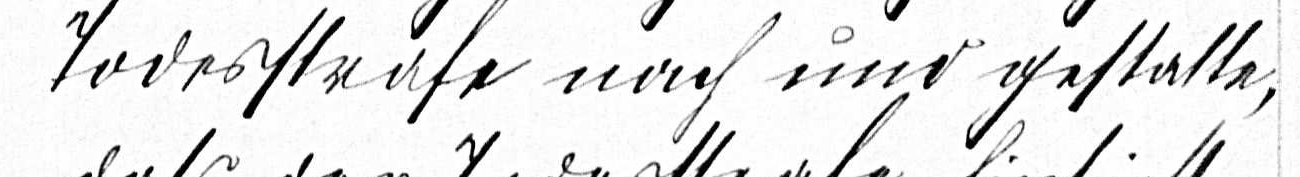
Todesstrafe nach und gestatte,
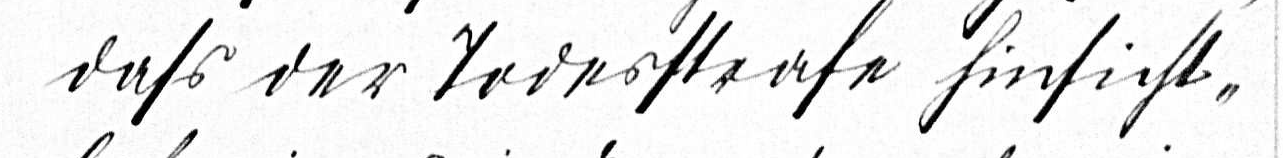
daß der Todesstrafe hinsicht¬
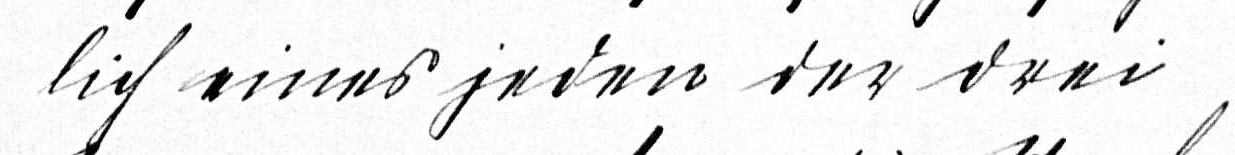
lich eines jeden der drei
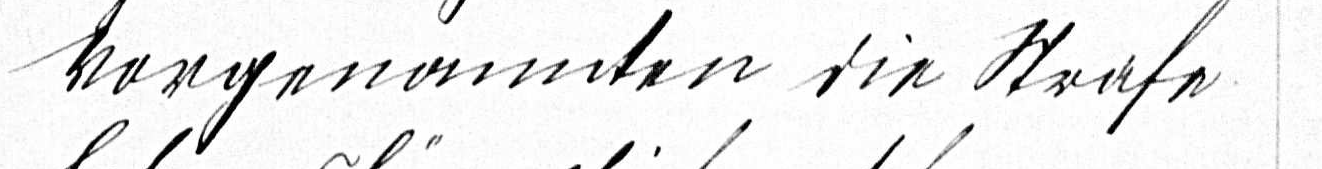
Vorgenannten die Strafe
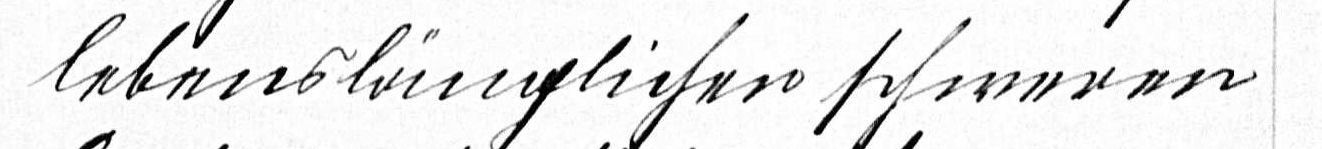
lebenslänglichen schweren
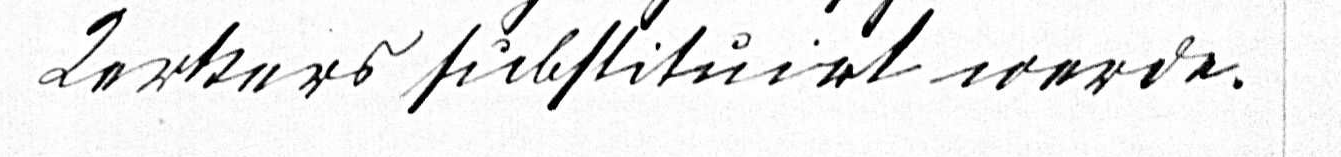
Kerkers substituirt werde.
